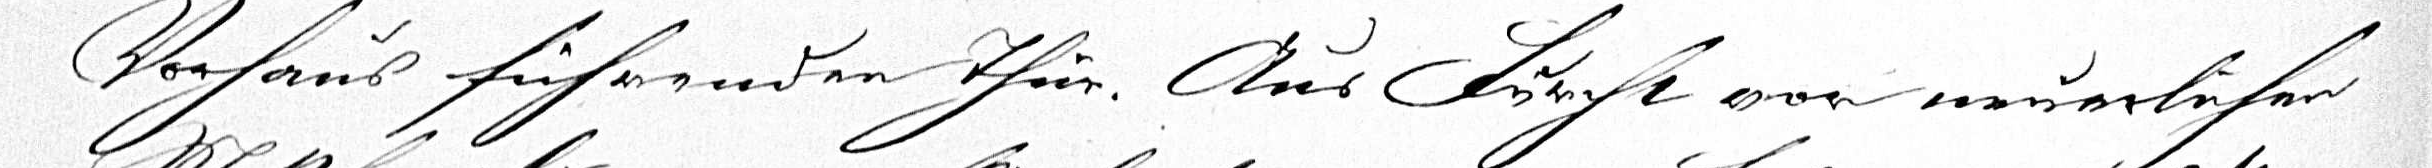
Vorhaus führenden Thür. Aus Furcht vor neuerlichen
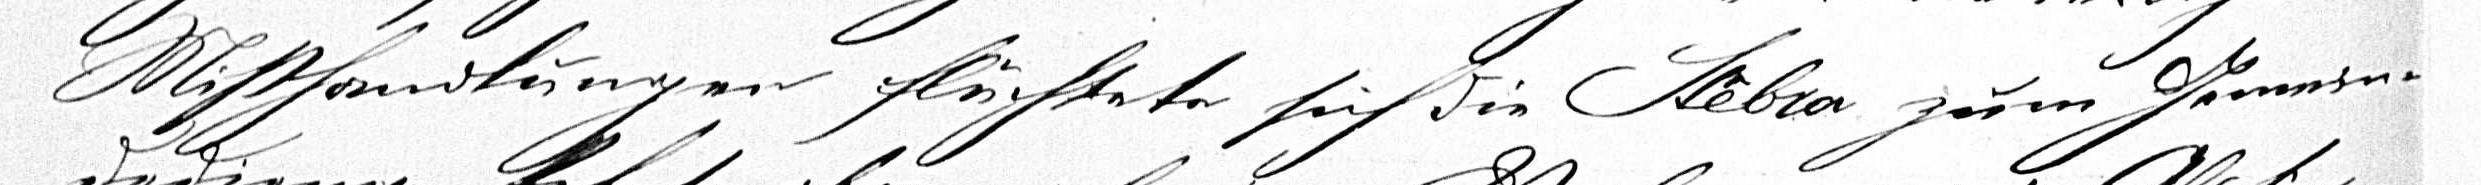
Mißhandlungen fluchtete sich die Stebra zum Gemein¬
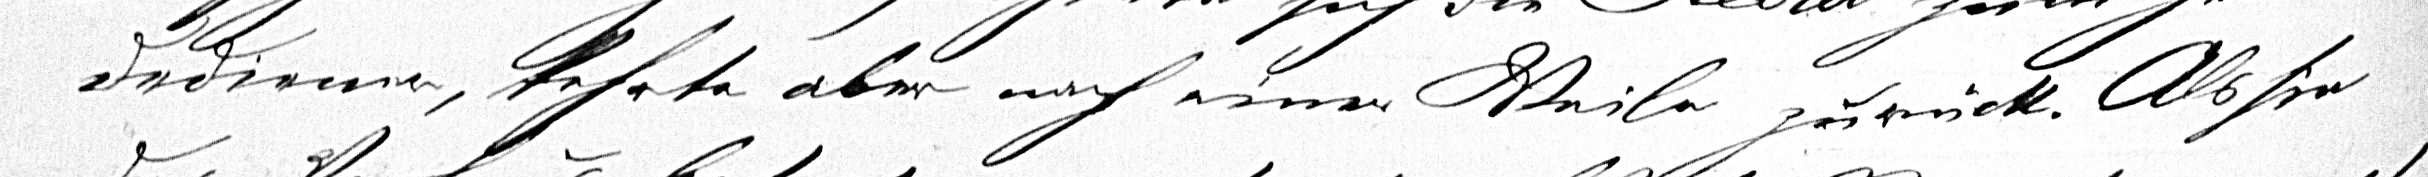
dediener, kehrte aber nach eine Weile zurück Als sie
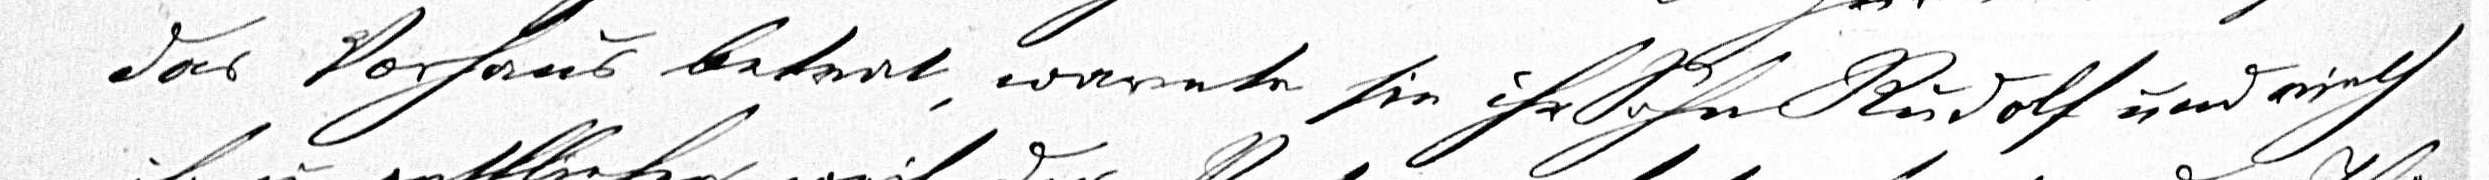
das Vorhaus betrat, waxxte sie ihr Sohn Rudolf und xx
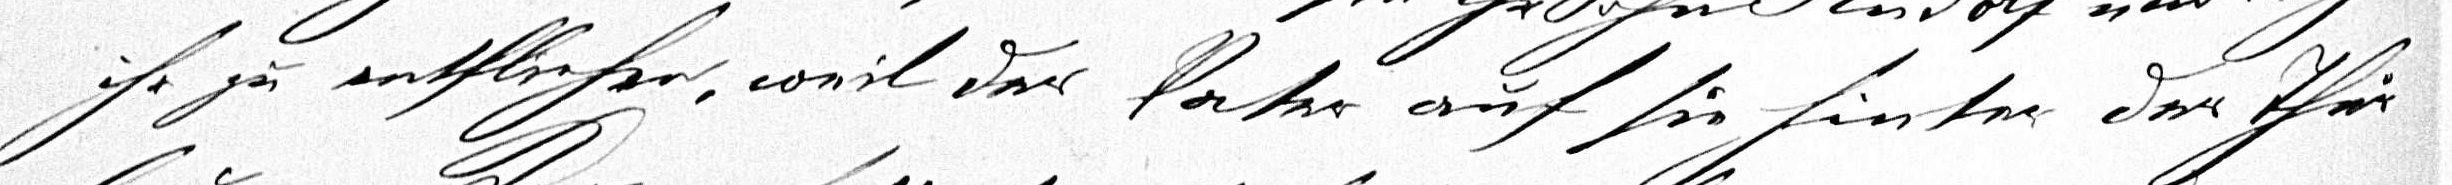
ihr zu entfliehen, weil der Vater auf sie hinter der Thur
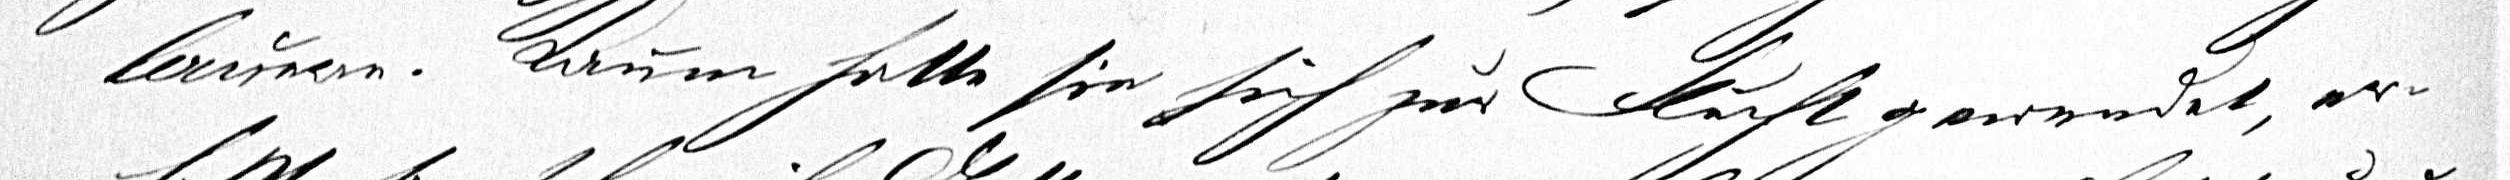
lauere. Kaum hatte sie sich zur Flucht gewendet, er¬
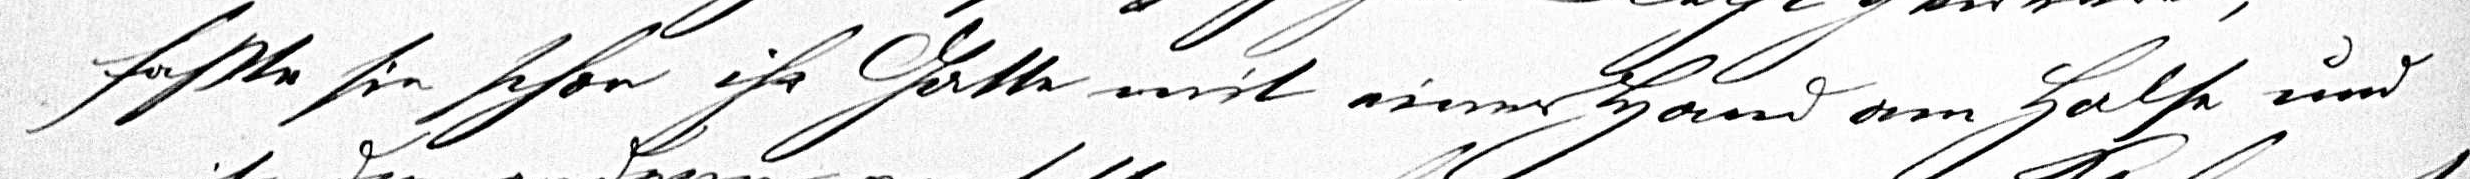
faßte sie schon ihr Gatte mit einer Hand am Halfe und
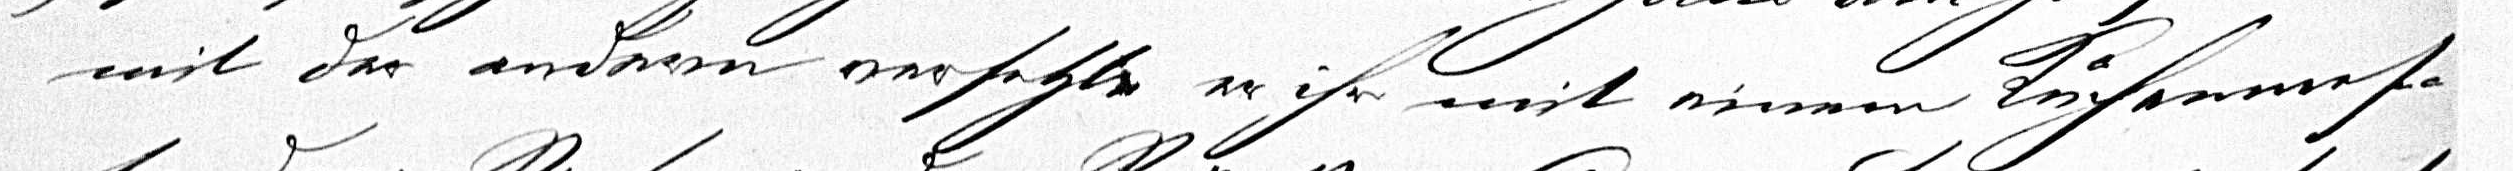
mit der andern versetzte er ihr mit einem Kuchenmes¬
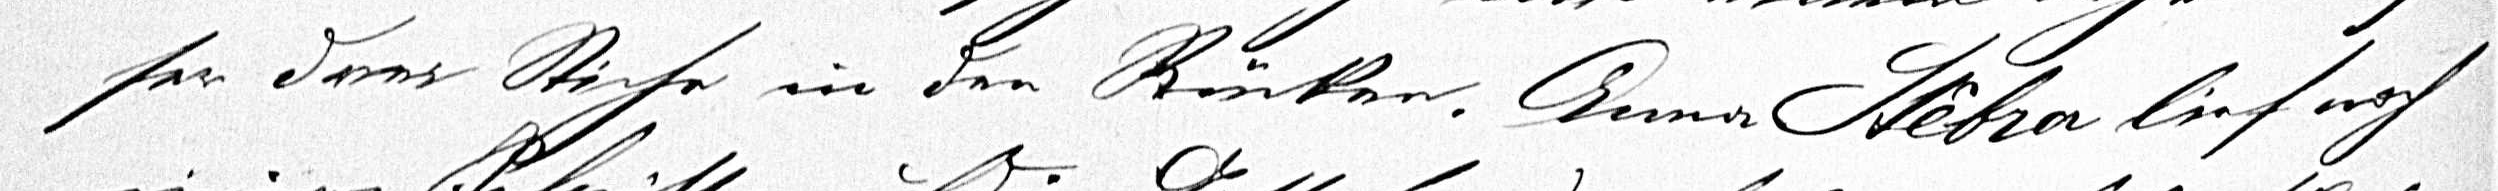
ser drei Stiche in den Rücken. Anna Stebra lief nach
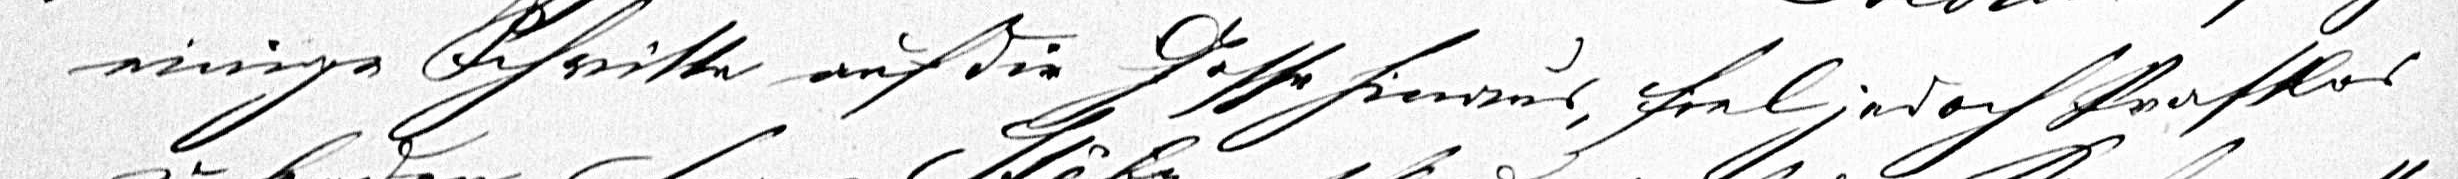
einige Schritte auf die Gasse hinaus, fiel jedoch xxaftlos
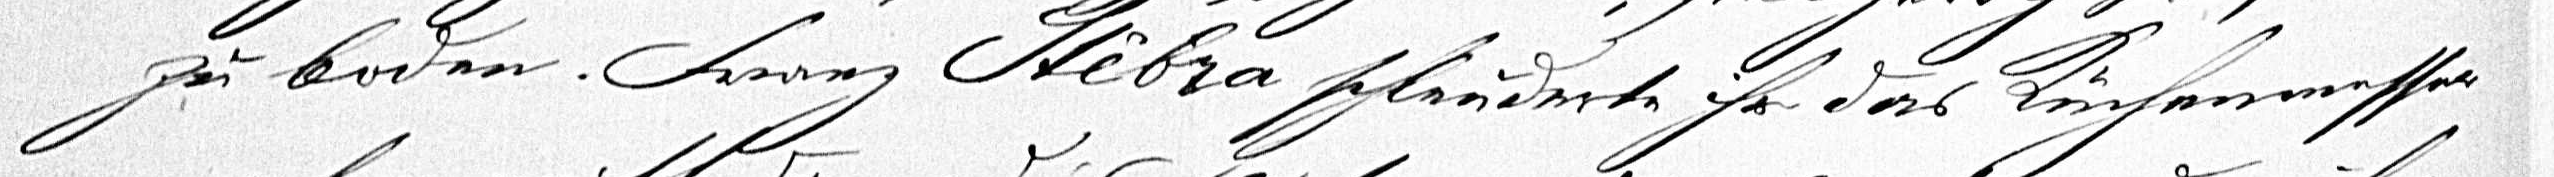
zu boden. Franz Stebra schleuderte ihr das Küchenmesser
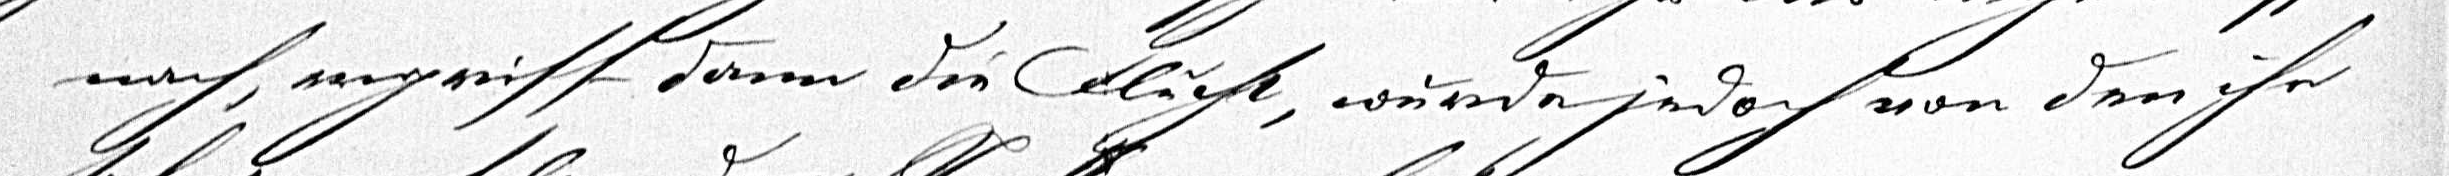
nach, ergrift dann die Flucht, wurde jedoch von den ihn
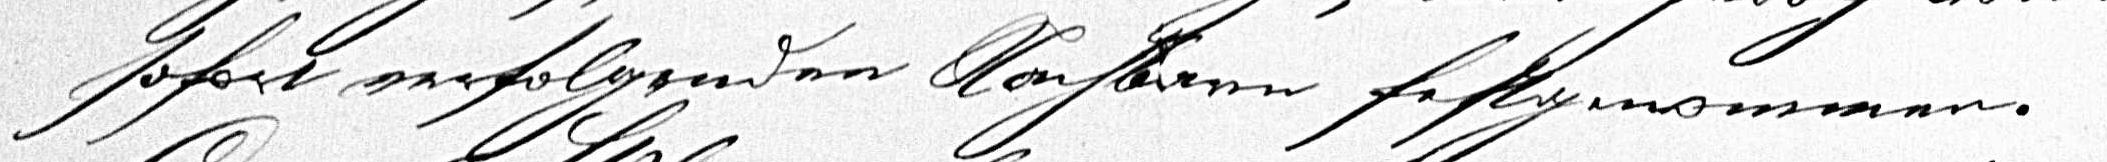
sofort verfolgenden Nachbarn festgenommen.
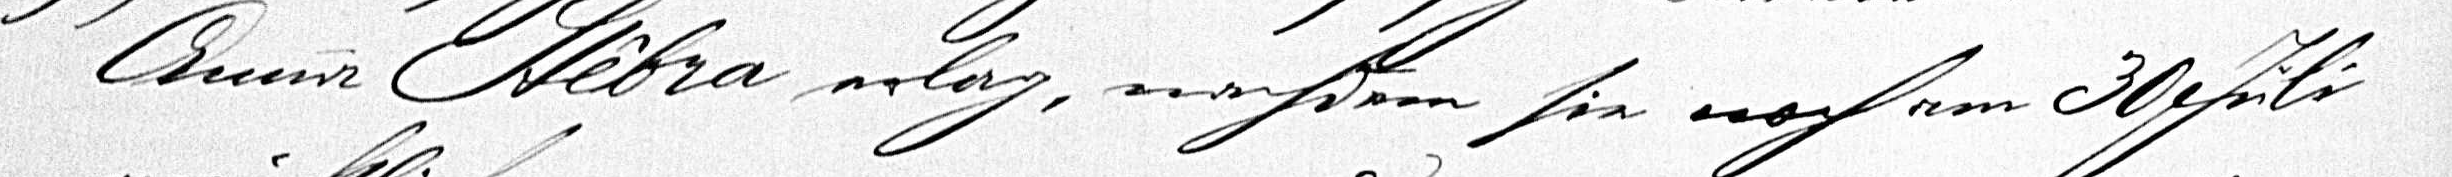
Anna Stebra erlag, nachdem sie noch am 30 Juli
